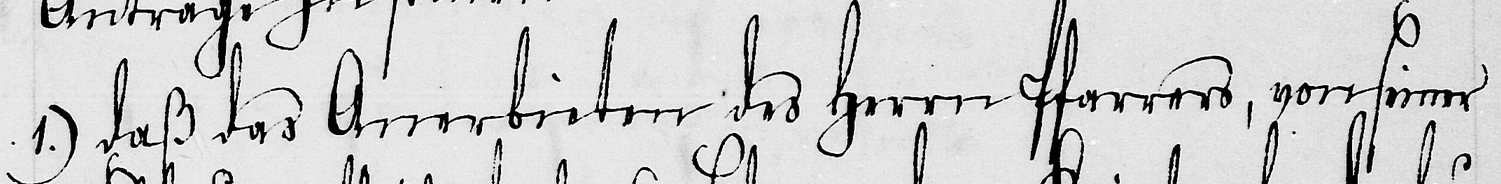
1.) daß das Anerbieten des Herrn Pfarrers, von seiner
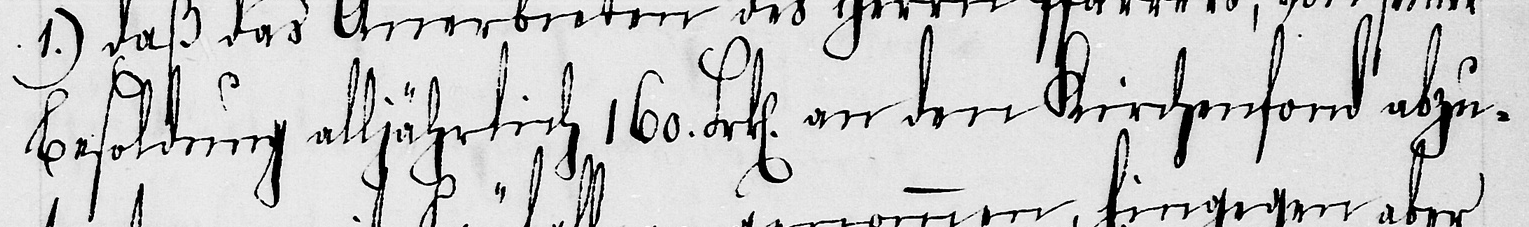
Besoldung alljährlich 160. Frk[en]. an den Kirchen¬
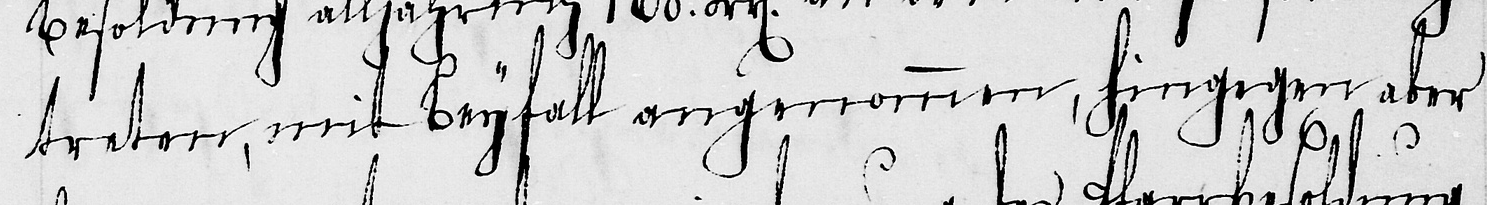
treten, mit Beyfall angenommen, hingegen aber
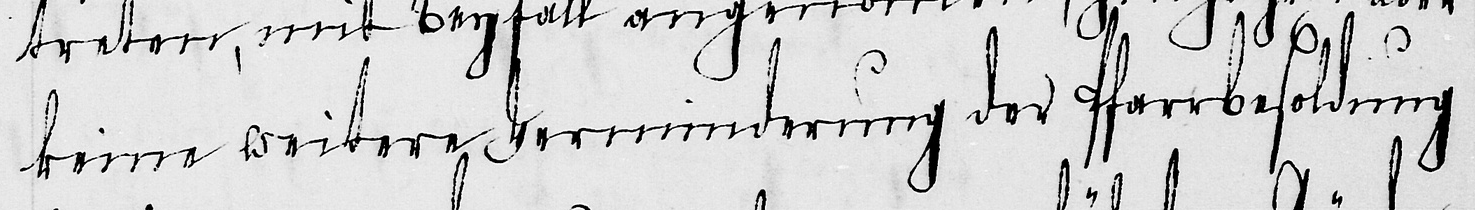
keine weitere Verminderung der Pfarrbesoldung
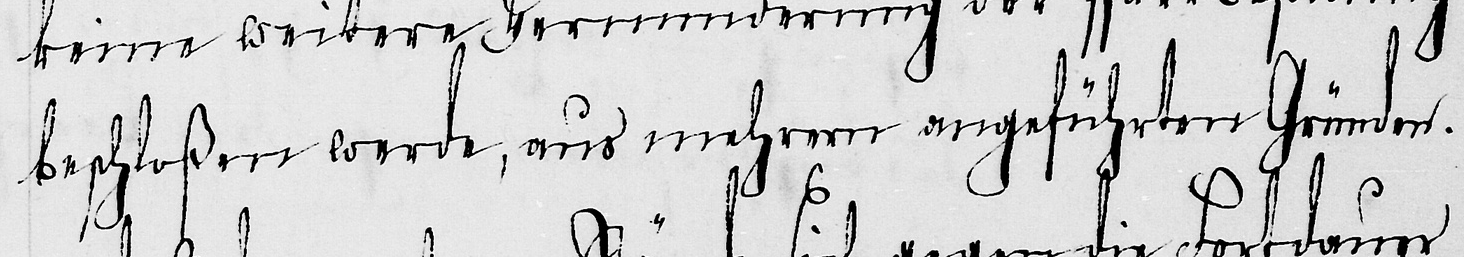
beschloßen werde, aus mehrern angeführten Gründen.
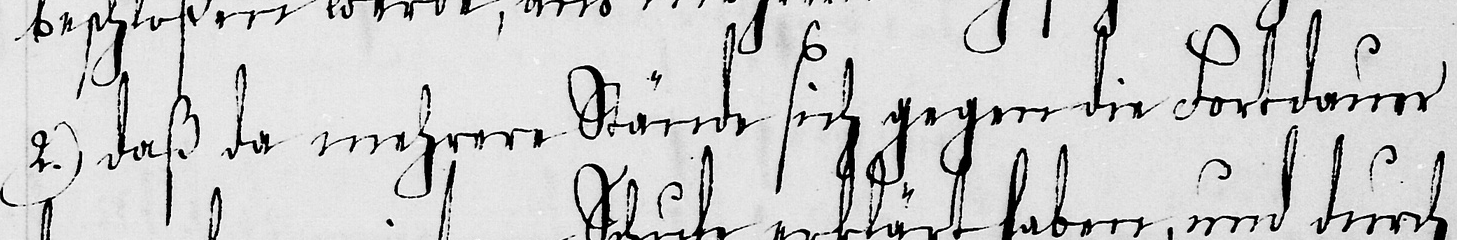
2.) daß da mehrere Stände sich gegen die Fortdauer
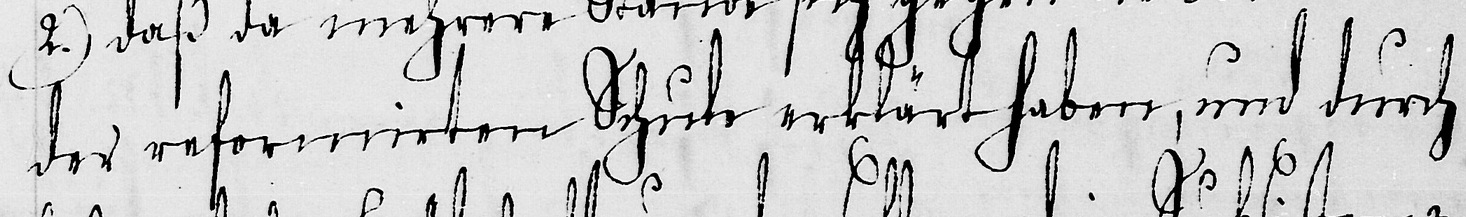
der reformirten Schule erklärt haben, und durch
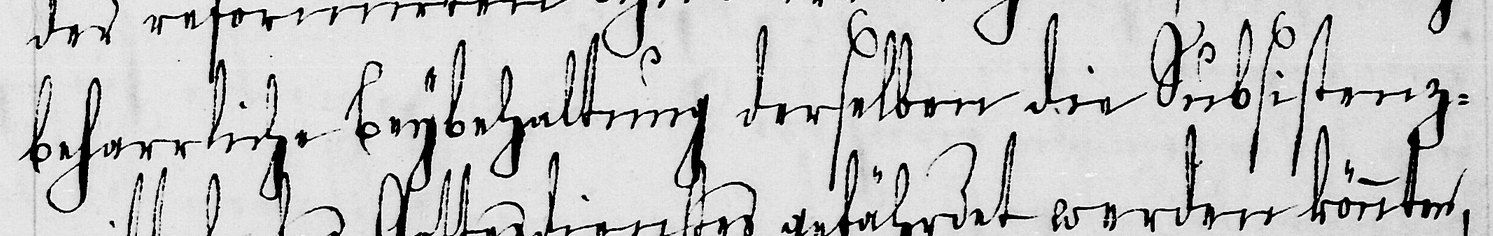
beharrliche Beybehaltung derselben die Subsistenz¬
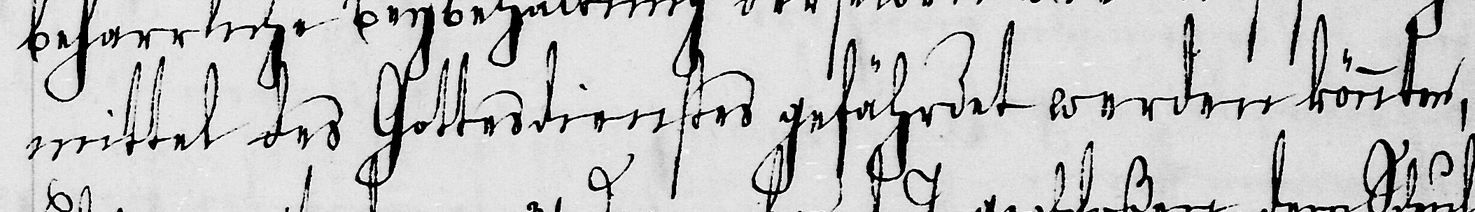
mittel des Gottesdienstes gefährdet werden könnte¬
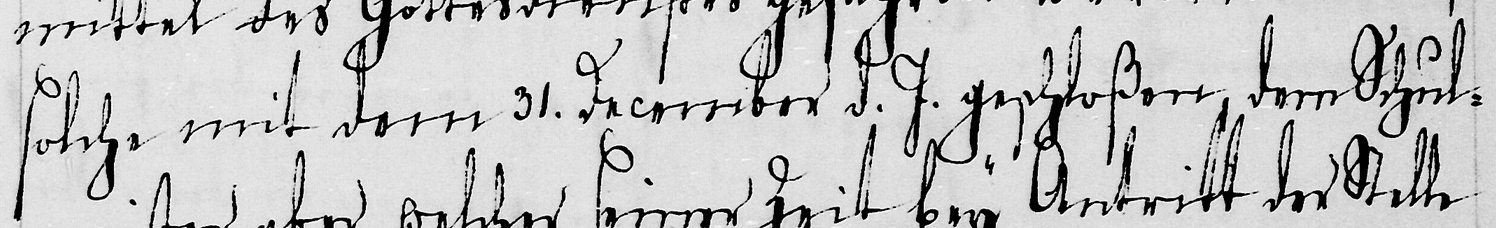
solche mit dem 31. December d. J. geschloßen, dem Schul¬
